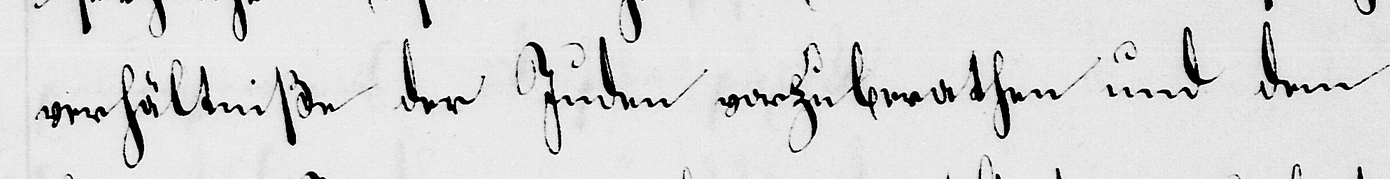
verhältniße der Juden vorzuberathen und dem
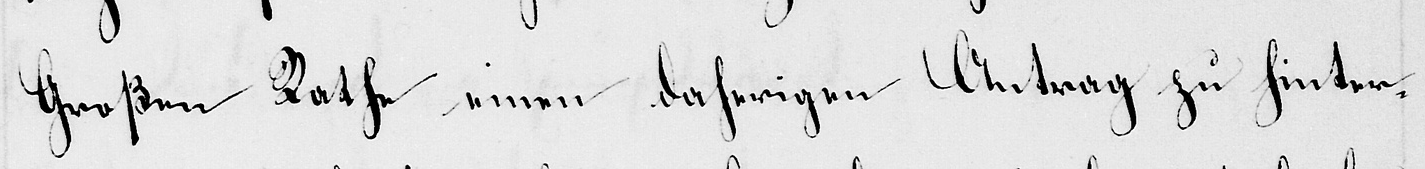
Großen Rathe einen daherigen Antrag zu hinter¬
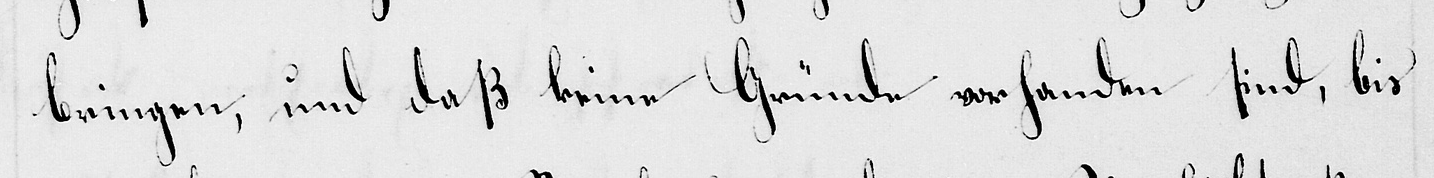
bringen, und daß keine Gründe vorhanden sind, bis
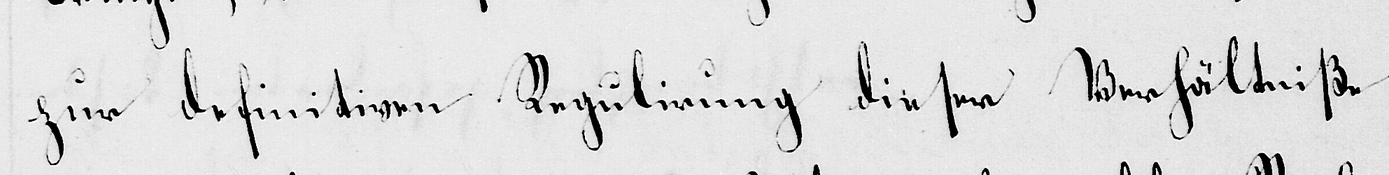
zur definitven Regulirung dieser Verhältniße
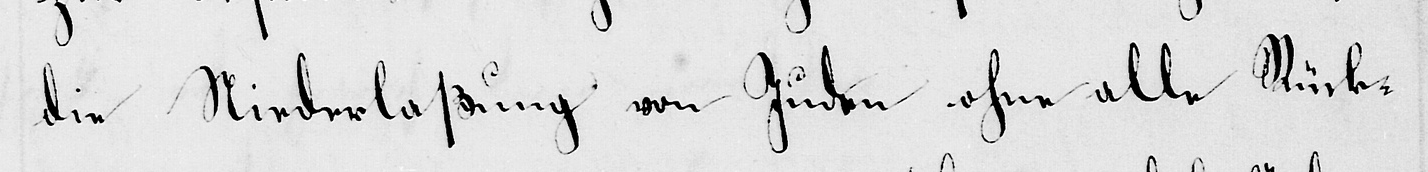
die Niederlaßung von Juden ohne alle Rück¬
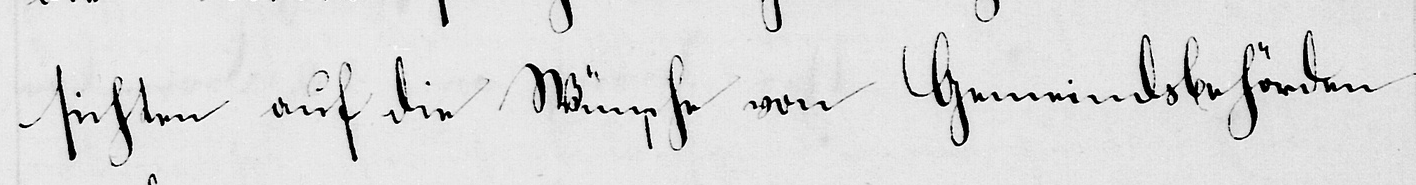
sichten auf die Wünsche von Gemeindsbehörden
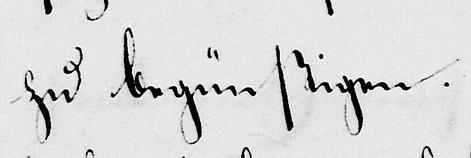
zu begünstigen.
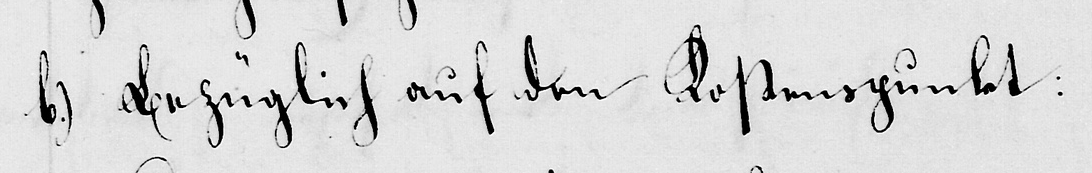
b.) Bezüglich auf den Kostenspunkt:
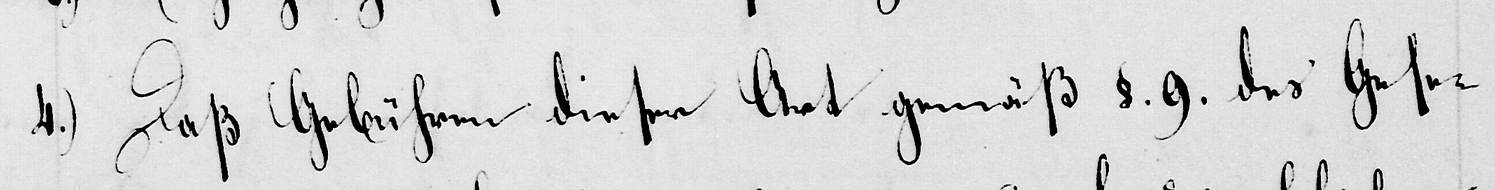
4.) Daß Gebühren dieser Art gemäß §. 9. des Gese¬
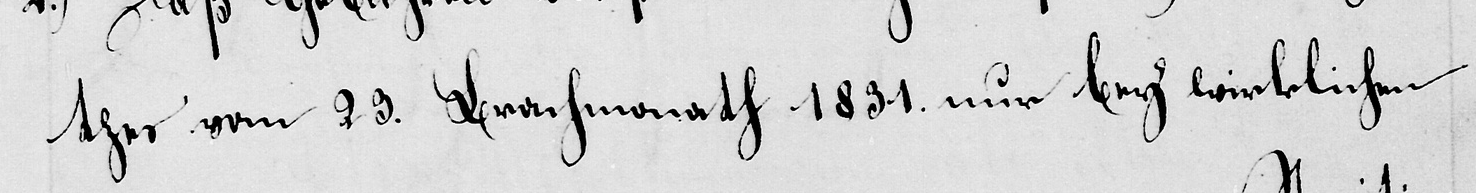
tzes vom 23. Brachmonath 1831. nur bey wirklichen
